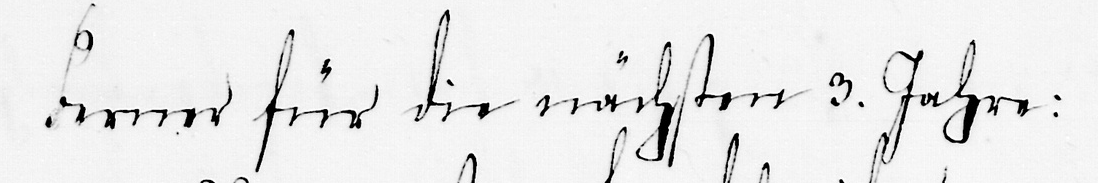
Ferner für die nächsten 3. Jahre:
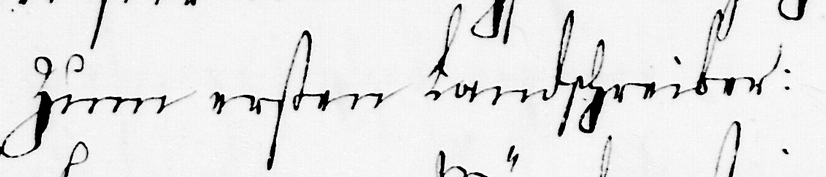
Zum ersten Landschreiber:
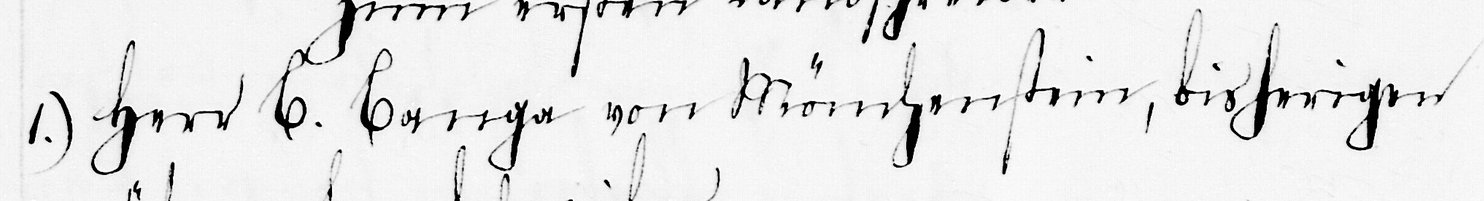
1.) Herr B. Banga von Mönchenstein, bisherigen
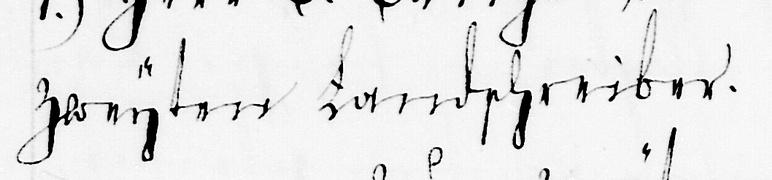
zweyten Landschreiber.
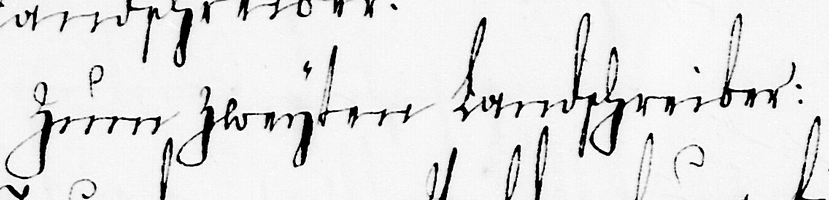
Zum zweyten Landschreiber:
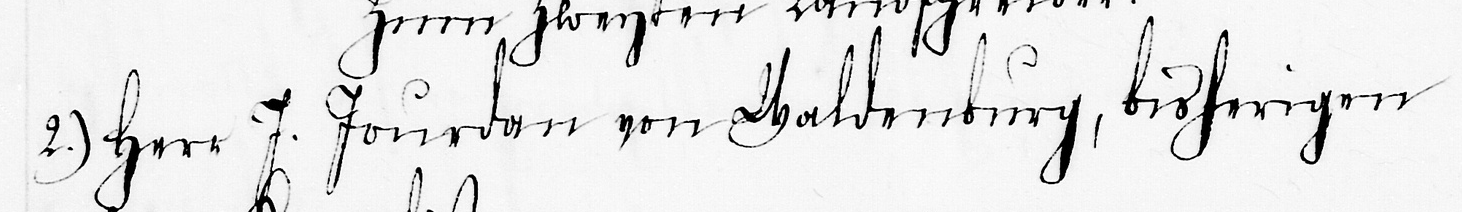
2.) Herr J. Jourdan von Waldenburg, bisherigen
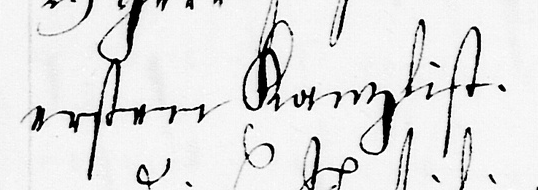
ersten Kanzlist.
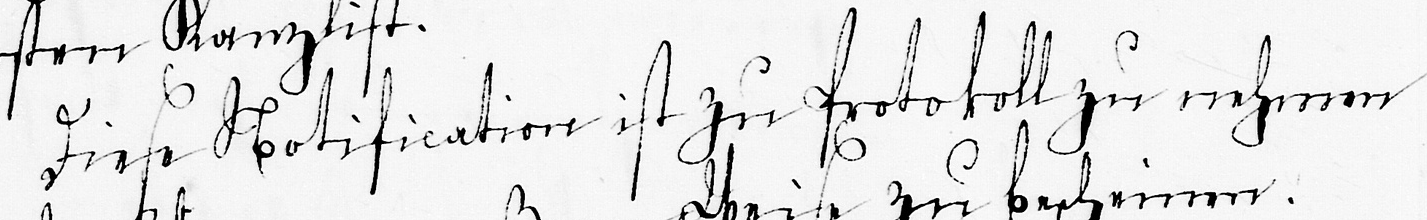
Diese Notification ist zu Protokoll zu nehmen
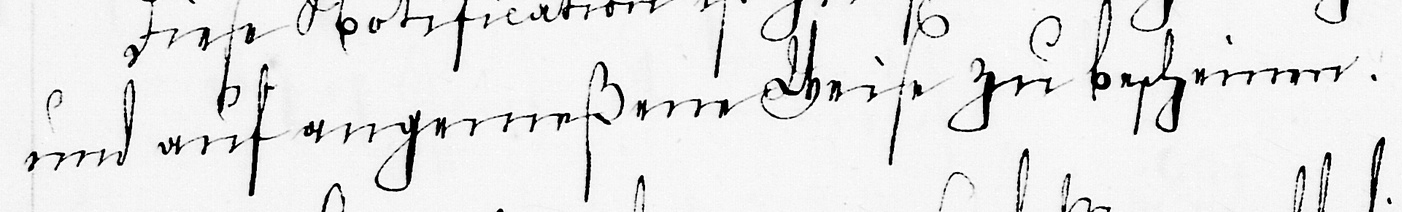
und auf angemeßene Weise zu bescheinen.
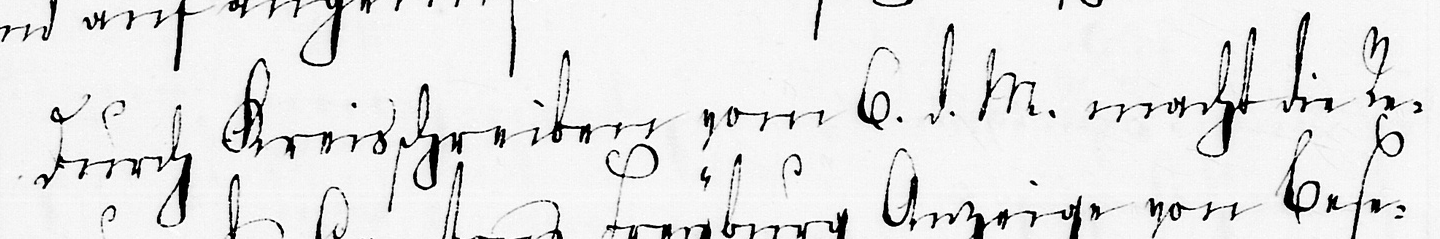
Durch Kreisschreiben vom 6. d. M. macht die Re¬
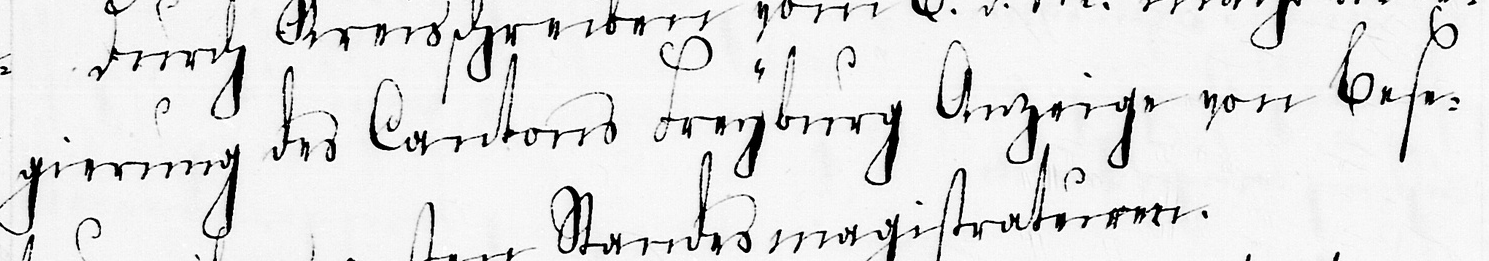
gierung des Cantons Freyburg Anzeige von Bese¬
